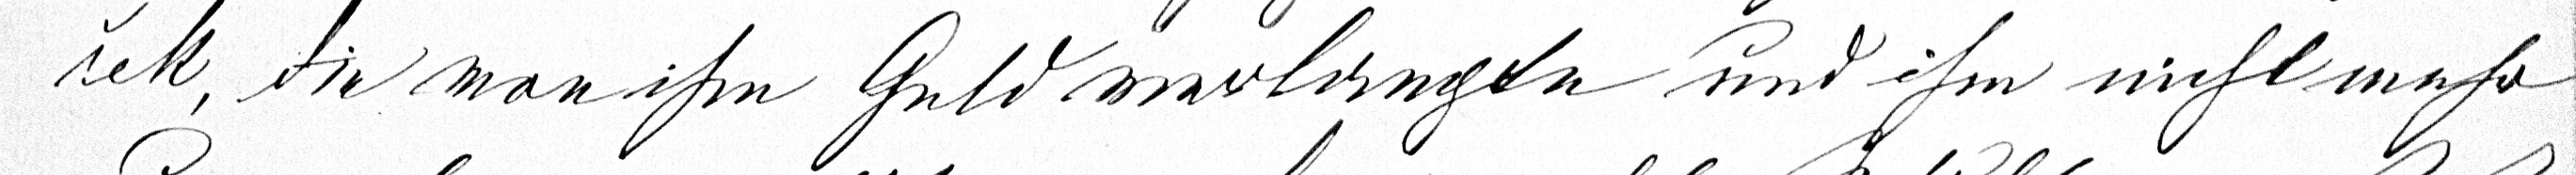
ček, die mon ihm Geldverlangte und ihm nicht mehr
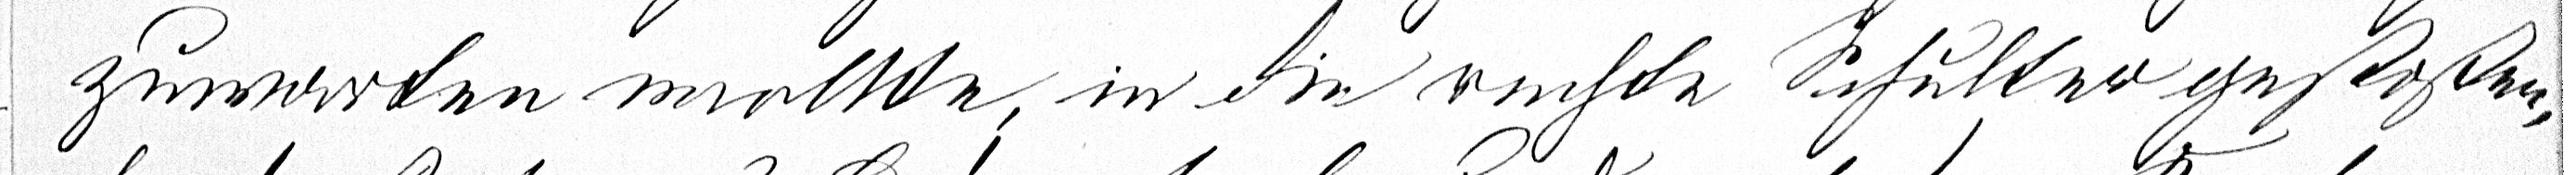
zuwarten wollte, in die rechte Schulter gestoßen,
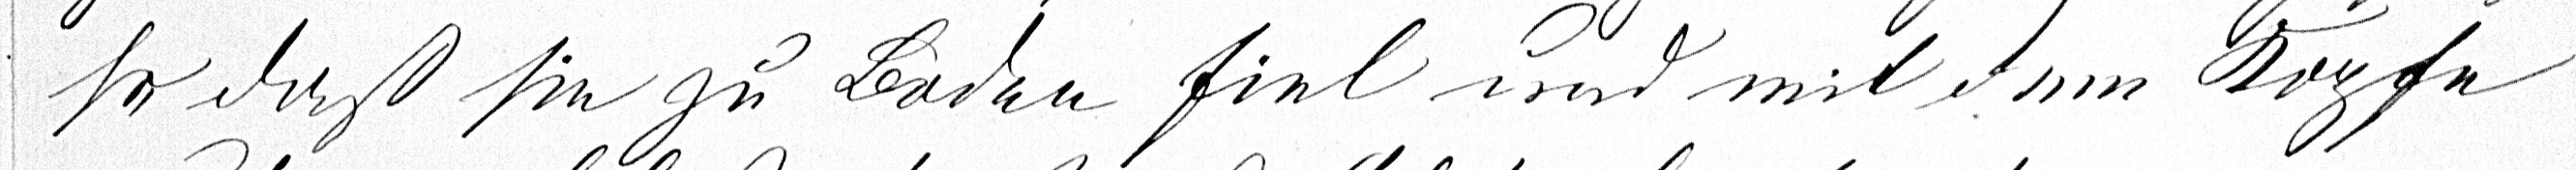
so daß sie zu Boden Fiel und mit dem Kopfe
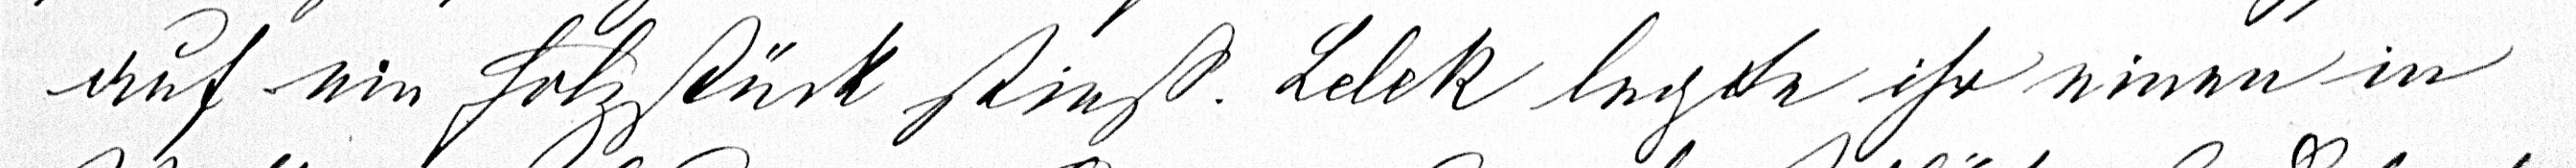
auf ein Holzstück stieß. Lelek leyte ihr einen in
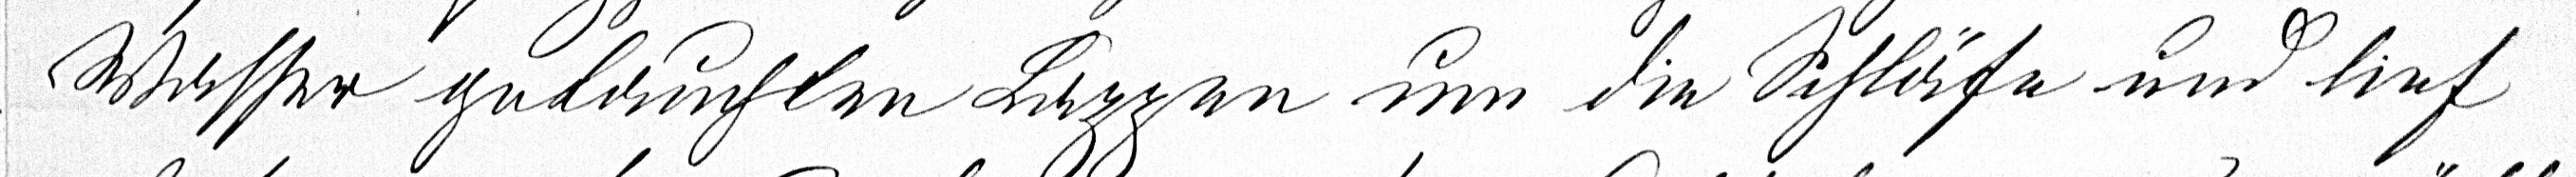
Wasser gelauchten Lappen um die Schläfe und lief
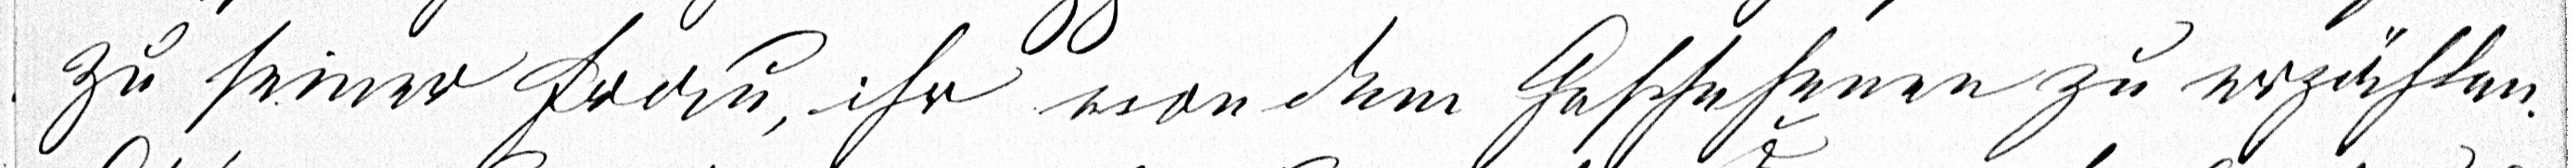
zu seiner Frau, ihr mon dem Geschehenen zu erzählen.
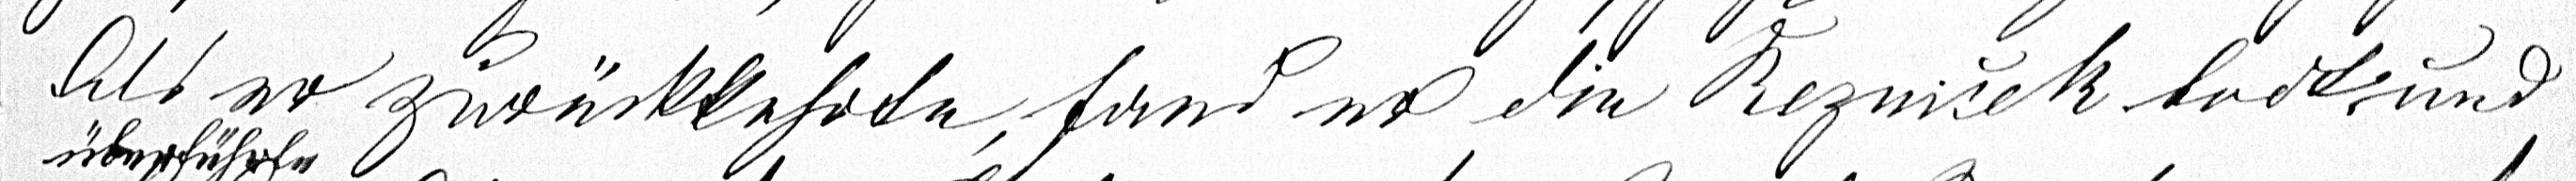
Als er zurückkehrte, fand er die Rezniček todt und
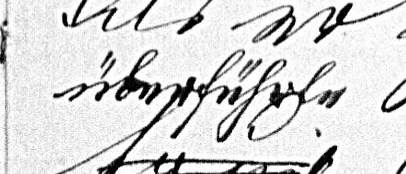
überführte
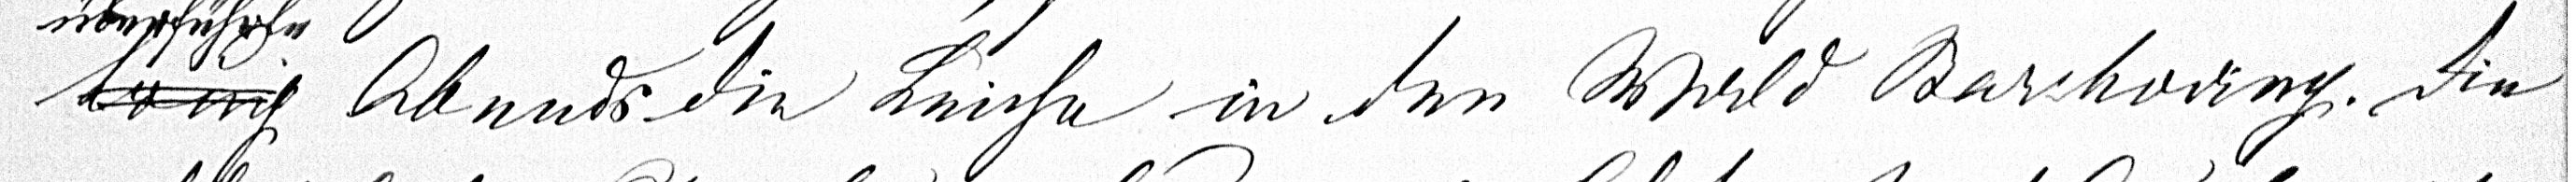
Abends die Leiche in den Wald Barchoding. Die
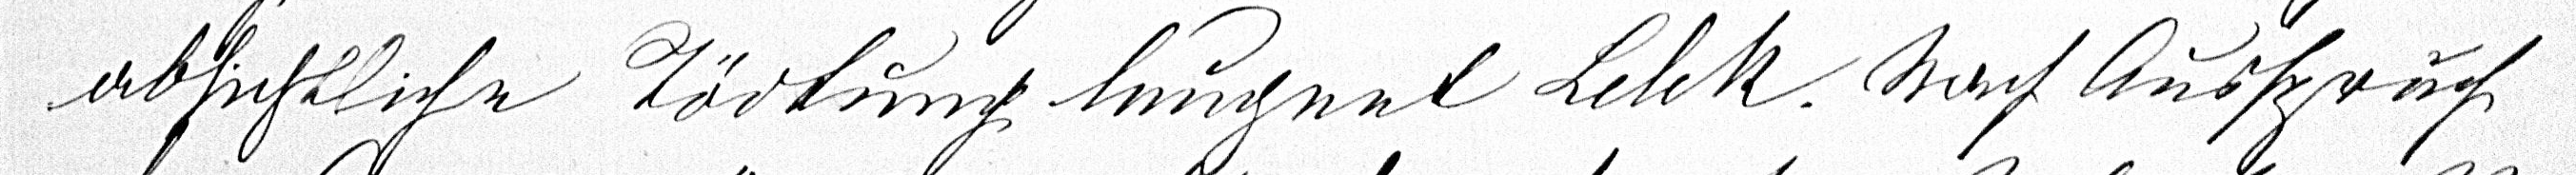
absichtliche Tödtung leugnet Lelek. Nach Ausspruch
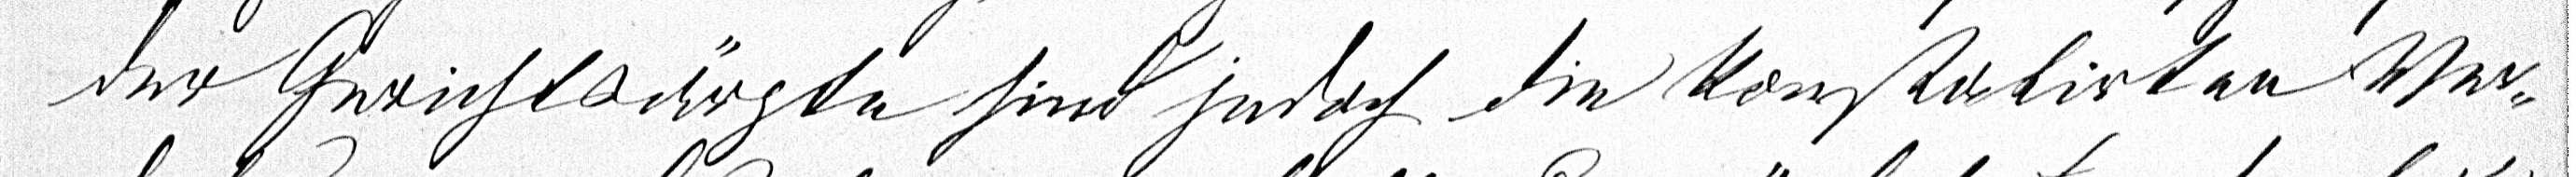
der Gerichtsärzte sind jedoch die konstatirten Ver¬
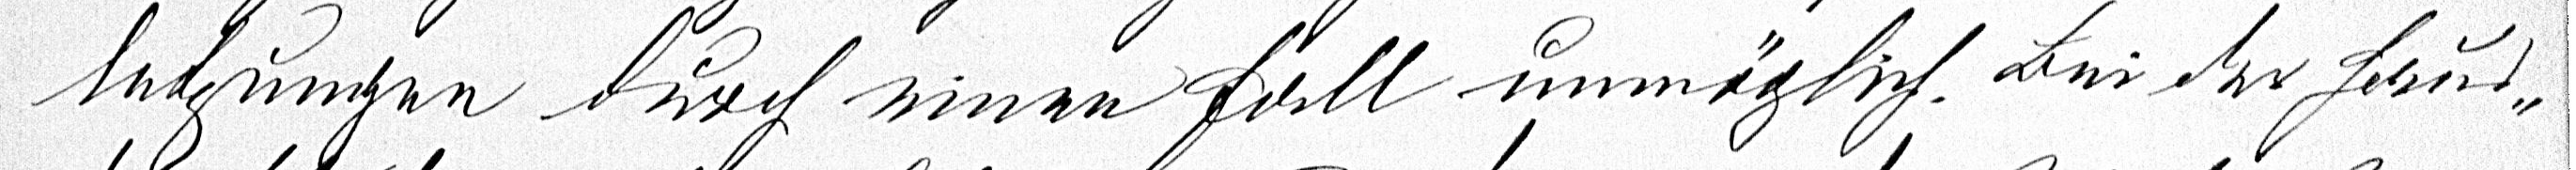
letzungen durch einen Fall unmöglich. Bei der Haus¬
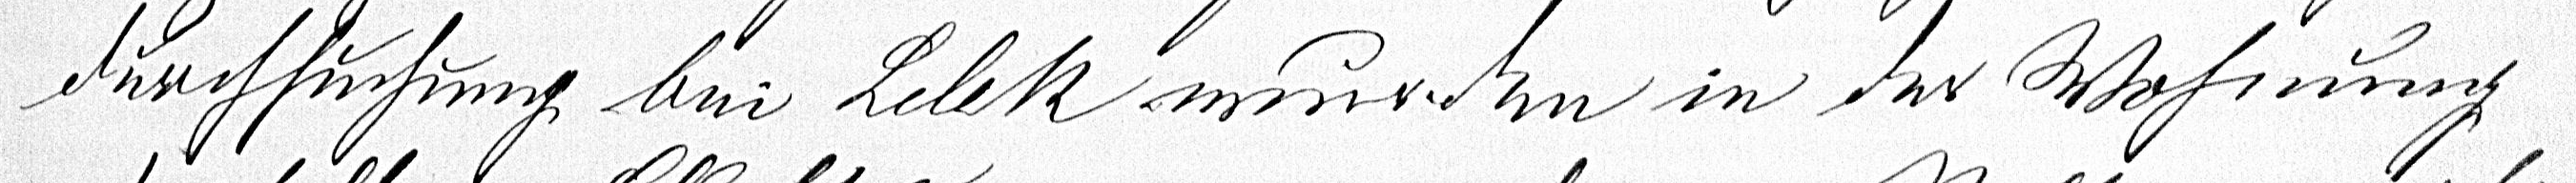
durchsuchung bei Lelek wurden in der Wohnung
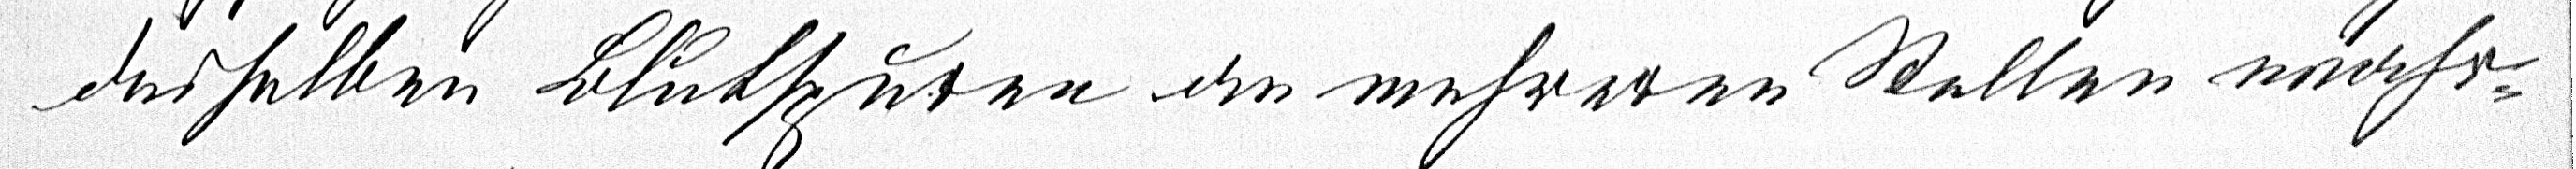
desselben Blutspuren an mehreren Stellen wahr¬
